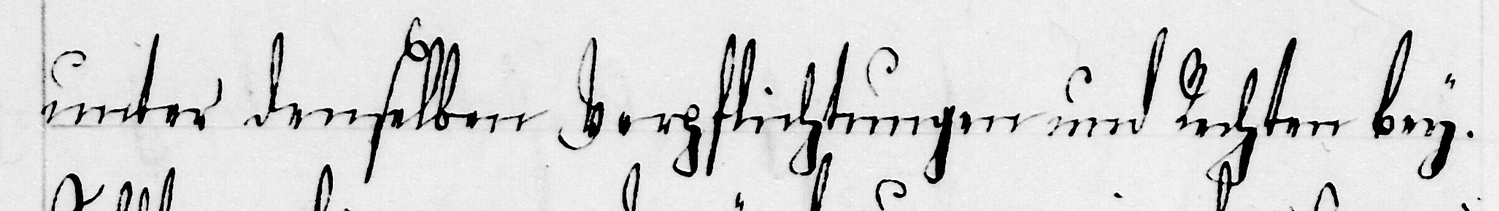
unter denselben Verpflichtungen und Rechten bey.
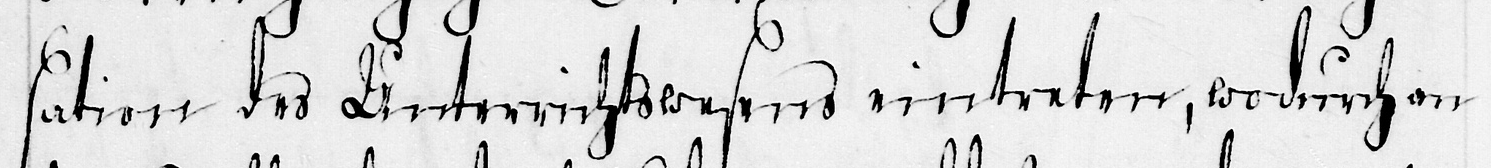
sation des Unterrichtswesens eintreten, wodurch an
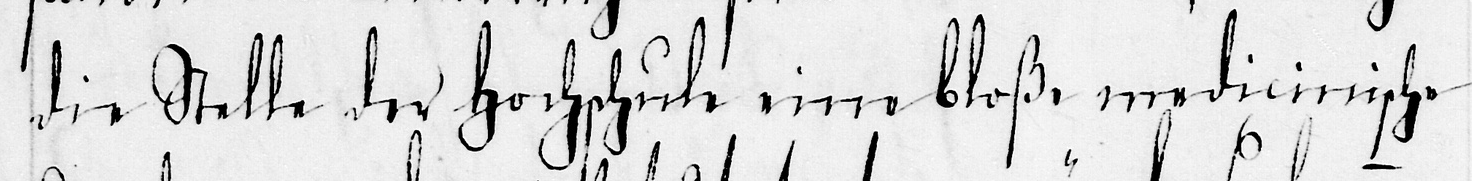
die Stelle der Hochschule eine bloße medicinische
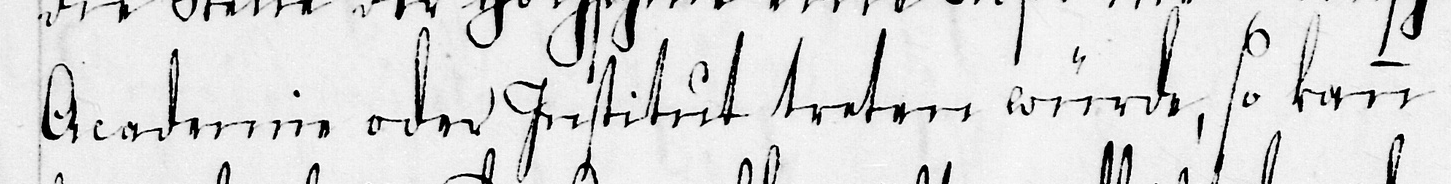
Academie oder Institut treten würde, so kann
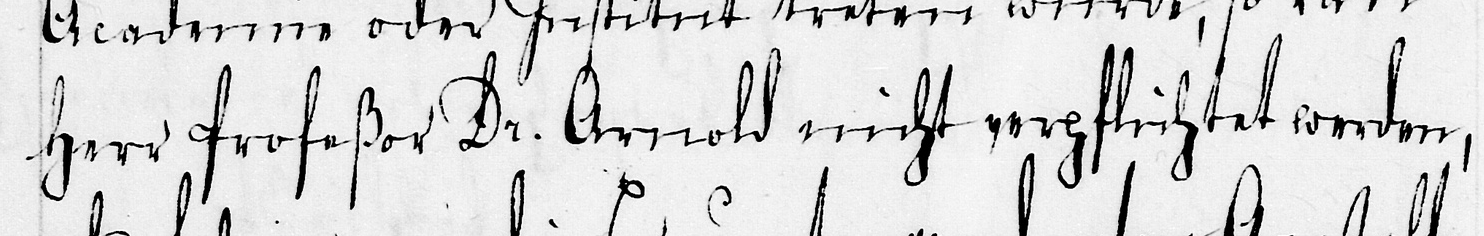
Herr Profeßor Dr. Arnold nicht verpflichtet werden,
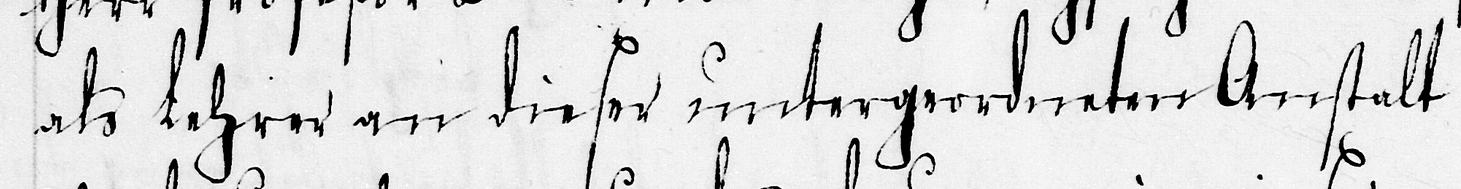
als Lehrer an dieser untergeordneten Anstalt
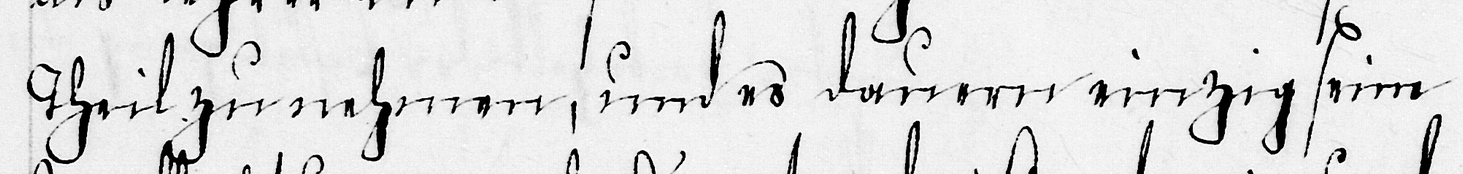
Theil zu nehmen, und es dauern einzig seine
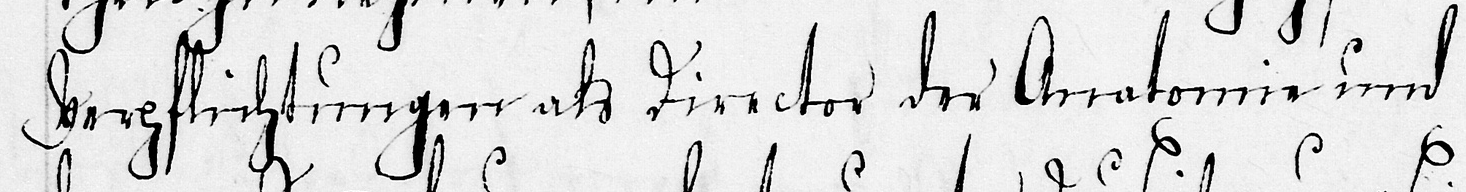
Verpflichtungen als Director der Anatomie und
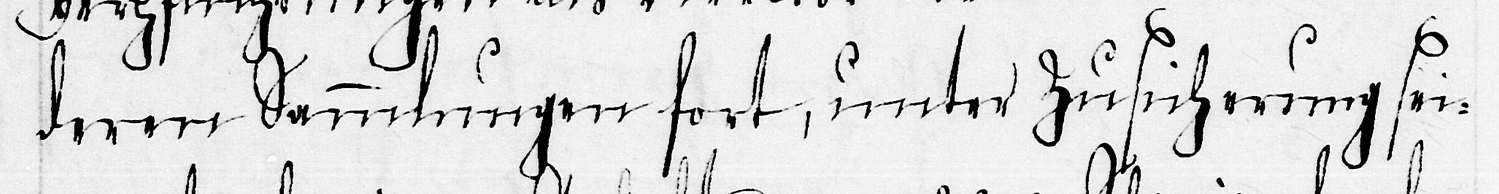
deren Sammlungen fort, unter Zusicherung sei¬
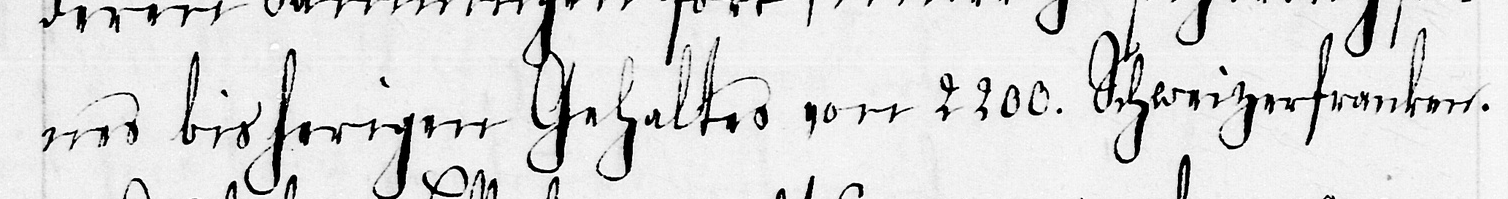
nes bisherigen Gehaltes von 2200. Schweizerfranken.
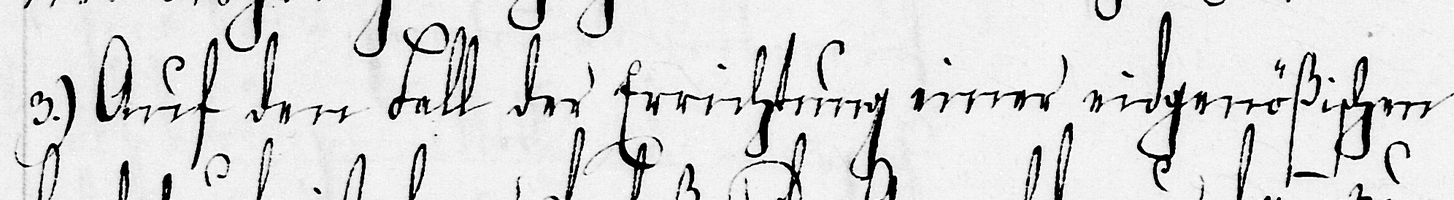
3.) Auf den Fall der Errichtung einer eidgenößischen
